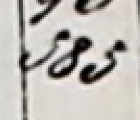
585
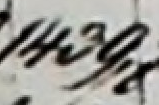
1439
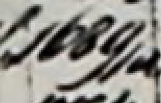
1689/a
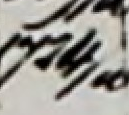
1714/a
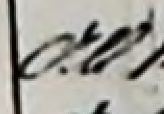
Alt
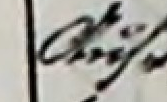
Auf
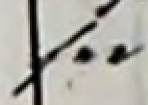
see
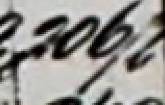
206/b
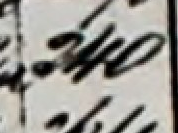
240
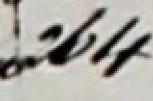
264
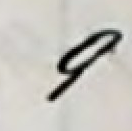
9
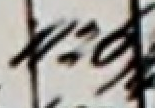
1126,4
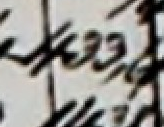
433,6
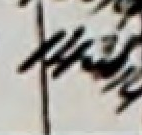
1438,4
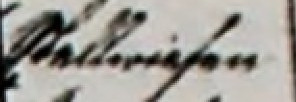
Stellwiesen
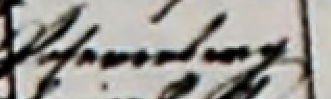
P???berg
